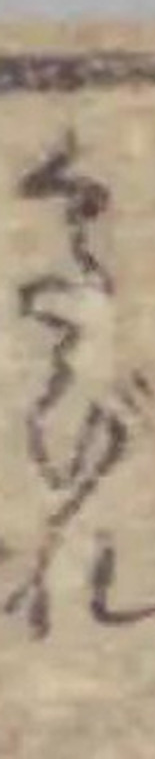くたびれ
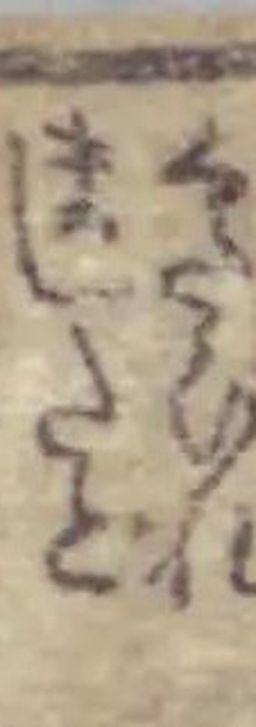ましたと
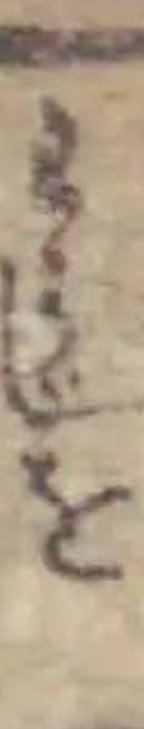わらじを
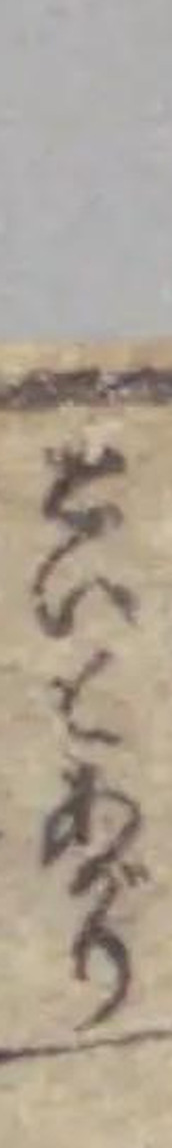といてあがり
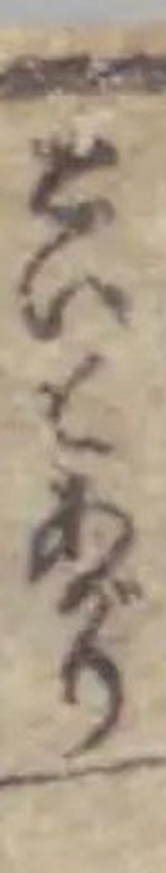といてあがり
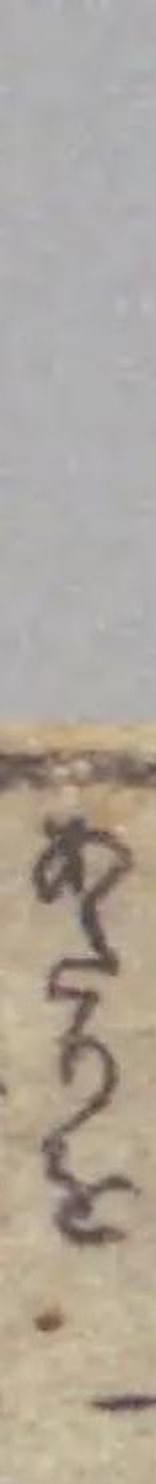あたりを
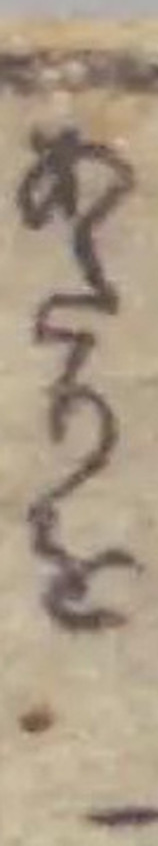あたりを
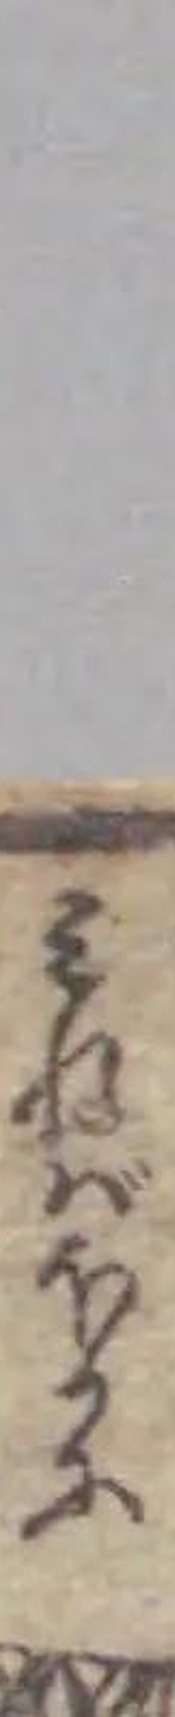みればほかに
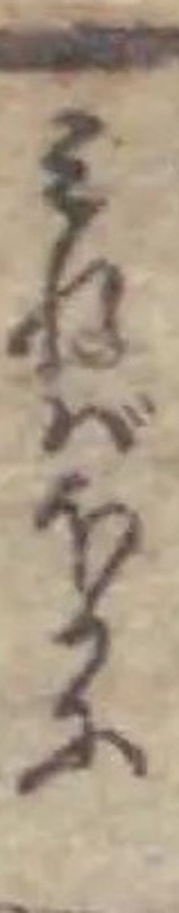みればほかに
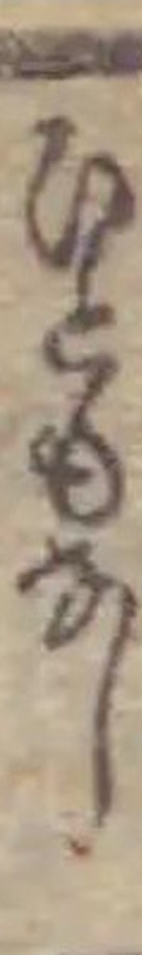ひともなし
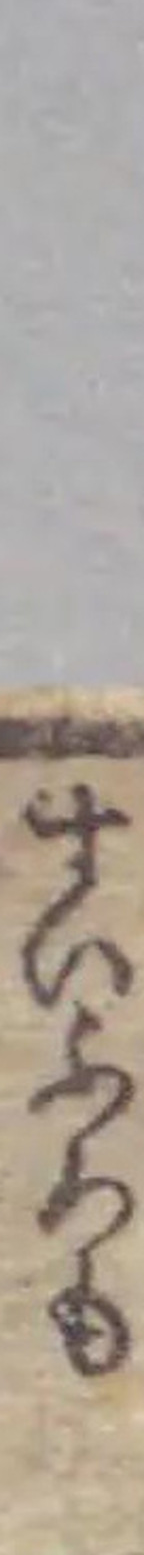すいふろも
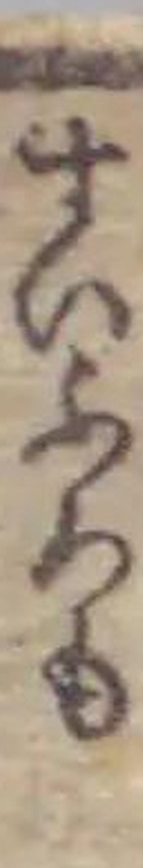すいふろも
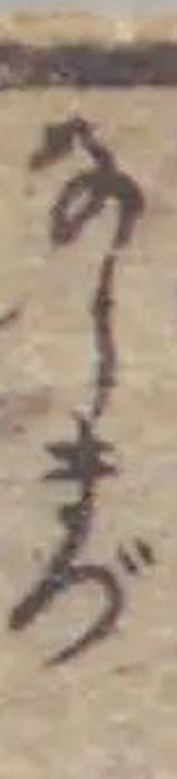なしまづ
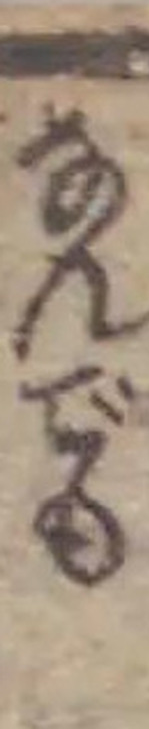なんでも
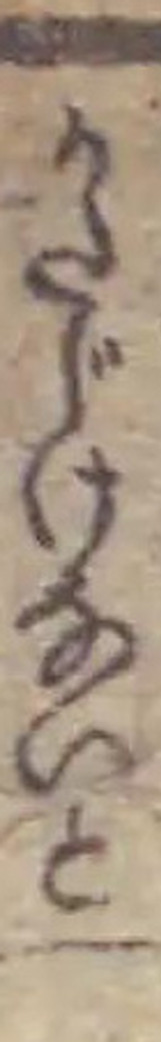かたじけないと

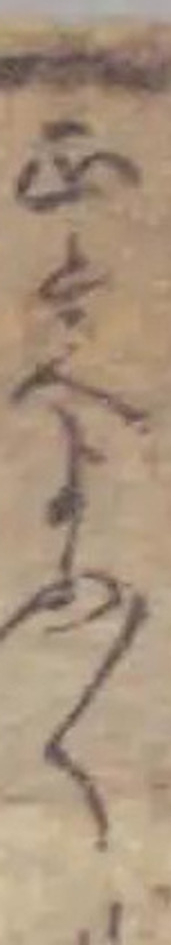正兵へよふ〳〵
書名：もふもふもふ怖噺 2巻
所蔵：国立国会図書館 National Diet Library, JAPAN
